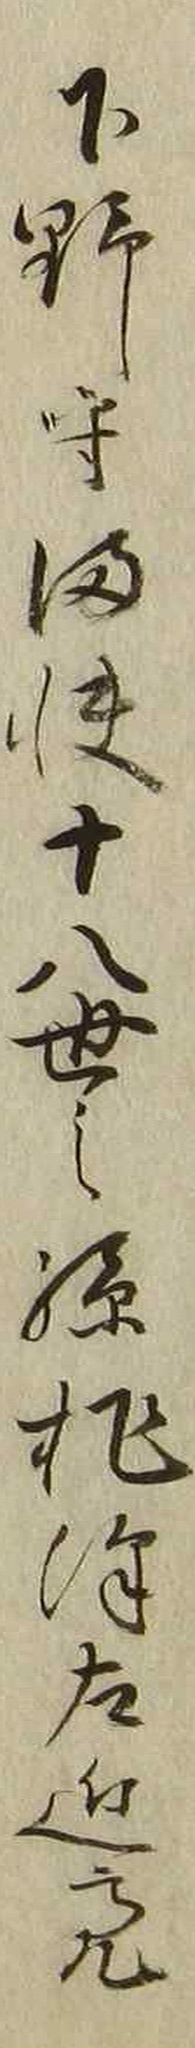下野守満快十八世之孫桃沢左近亮
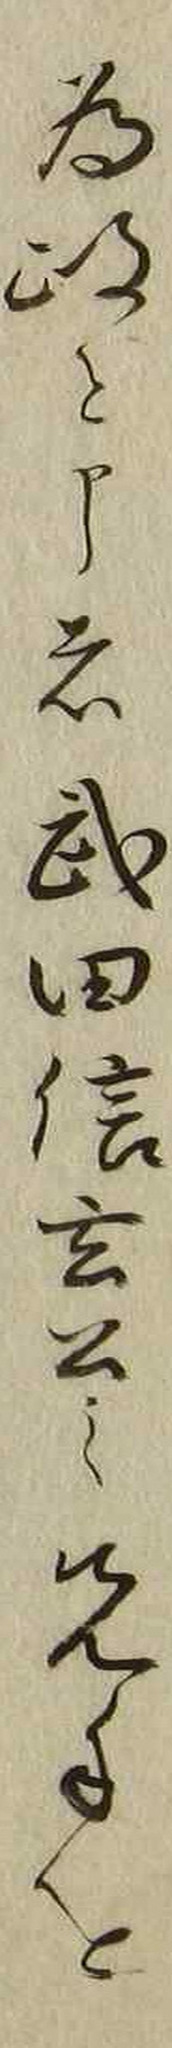為政と申者武田信玄公之先手を
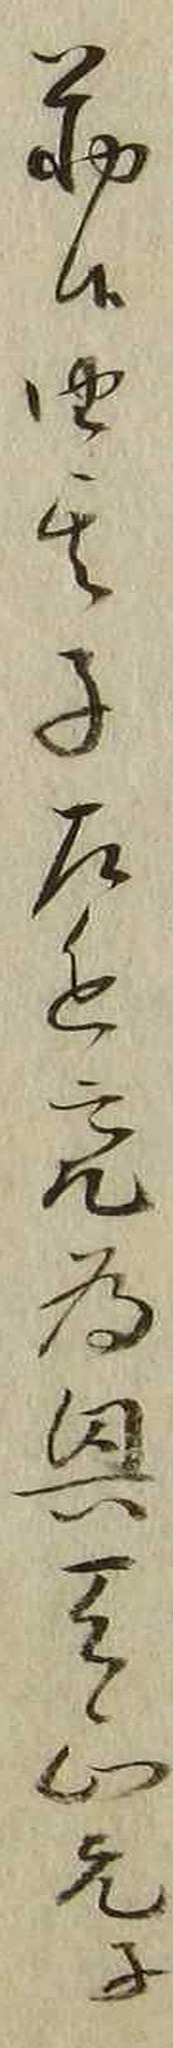勤候由其子左近亮為興天正元子
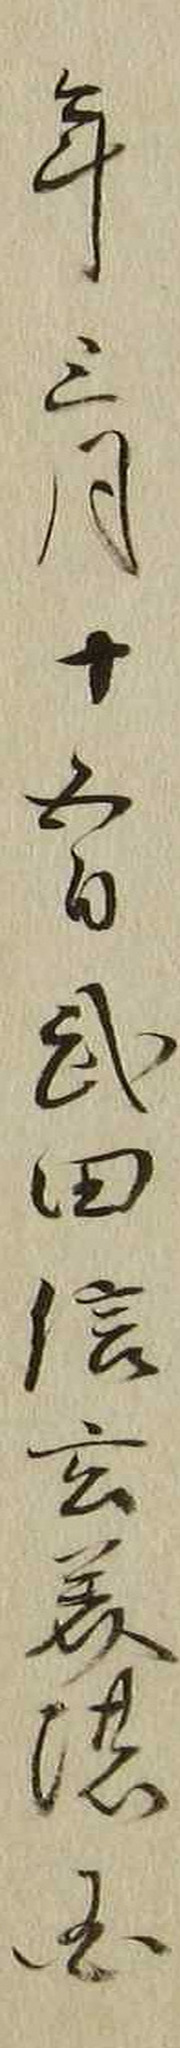年三月十五日武田信玄美濃国
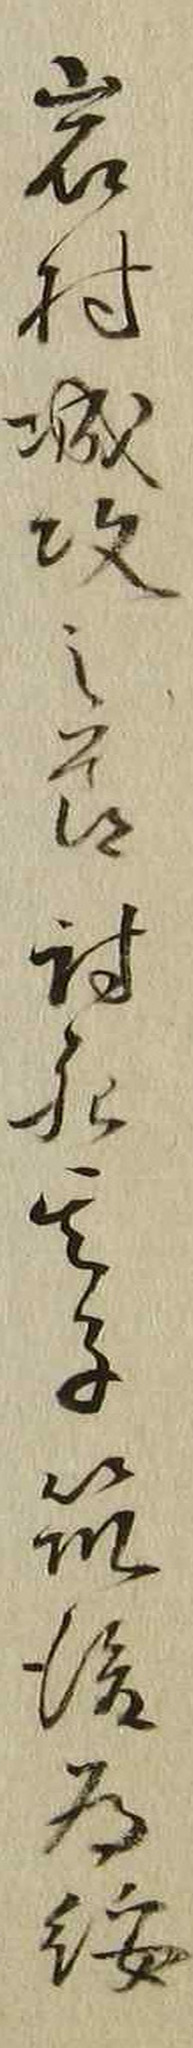岩村城攻之節討死其子筑後為綏
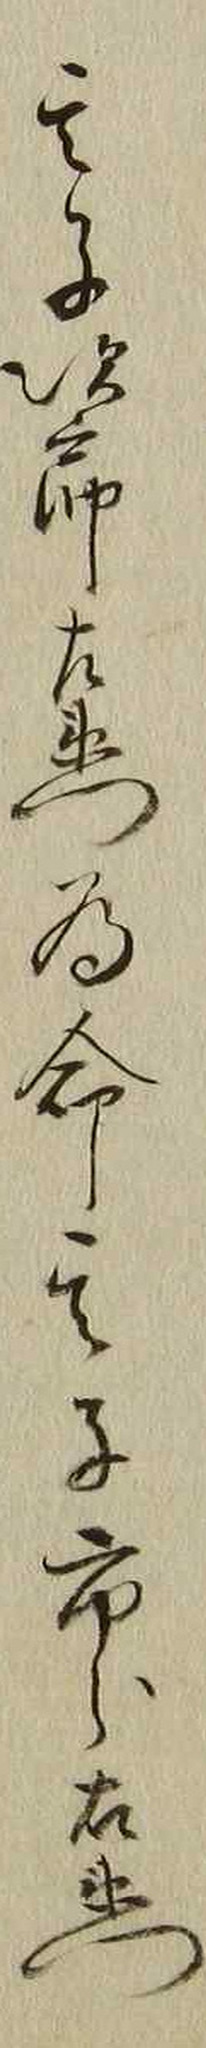其子次郎左衛門為命其子市郎右衛門
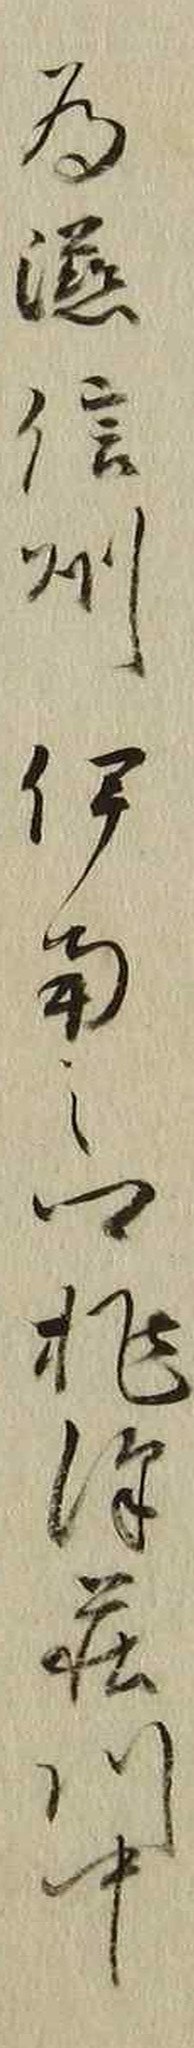為濨信州伊南之郷桃沢荘川中
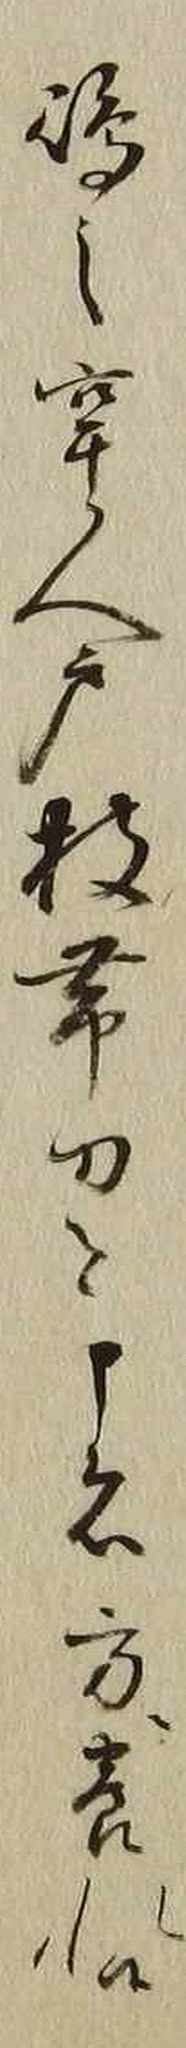嶋之牢人戸枝帯刀と申者方ニ養れ候
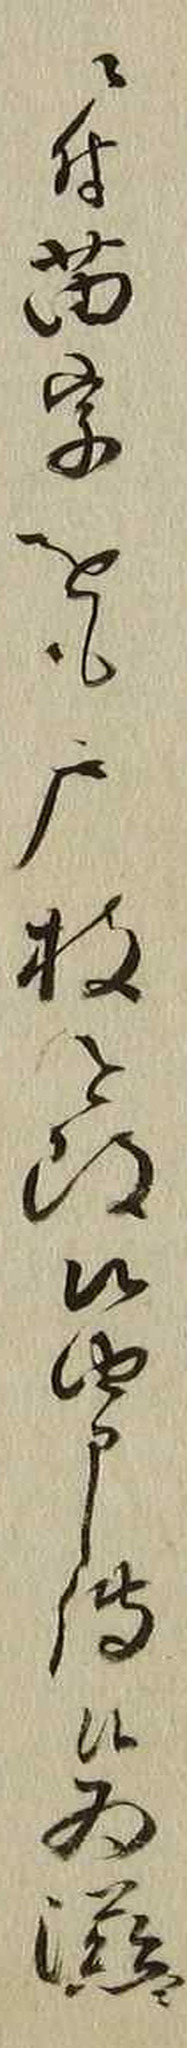ニ付苗字をも戸枝と改候由申伝候為濨ニ
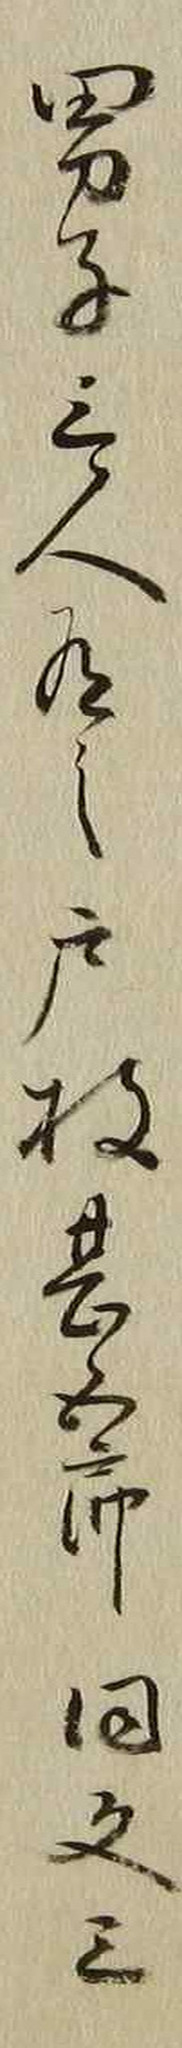男子三人有之戸枝甚五郎同文三
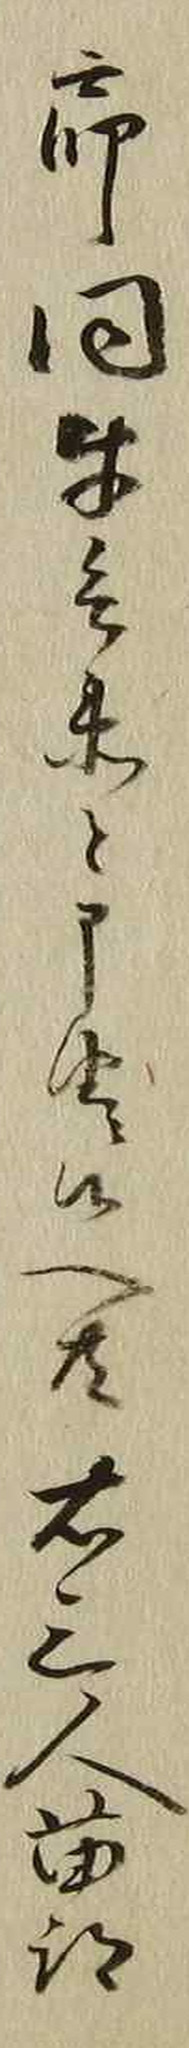郎同半兵衛と申由ニ候へ共右三人苗跡
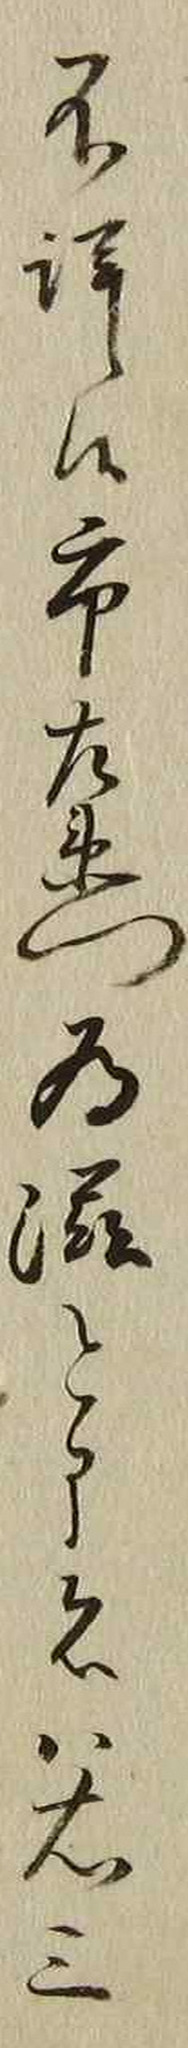不詳候市左衛門為滋と申者ハ右三
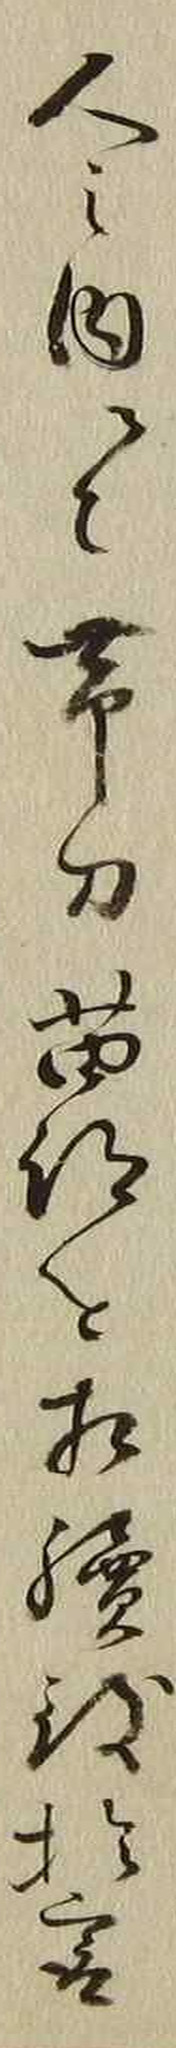人之内ニて帯刀苗跡を相続致於最
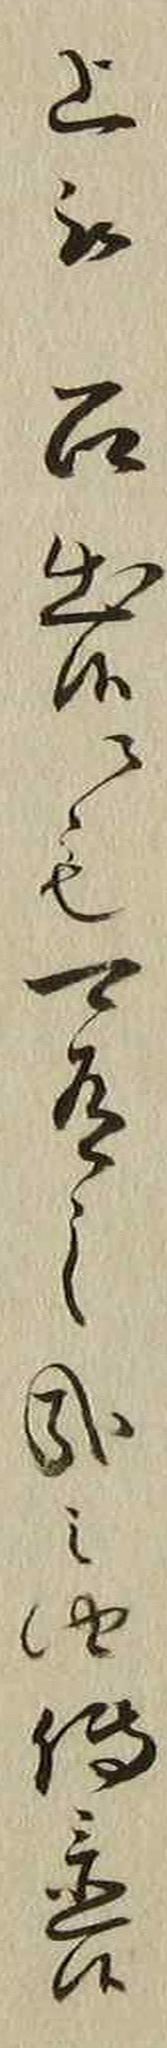上被召出候ニも可有之哉之由伝置候
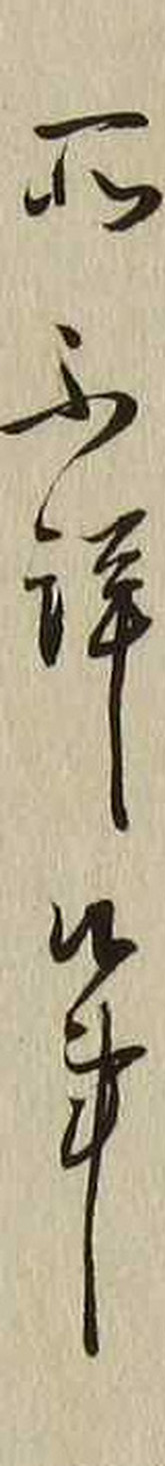所不詳候事
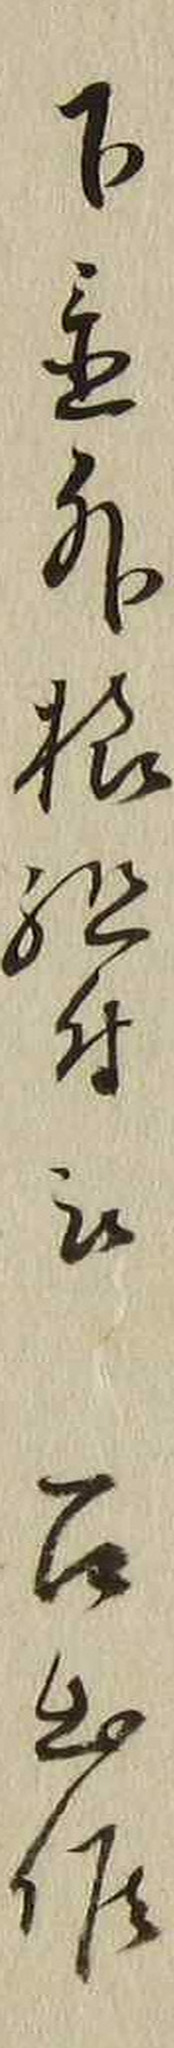下置外様組付被召出候
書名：諸士系譜　巻之59　と之部2
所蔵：会津若松市立会津図書館
